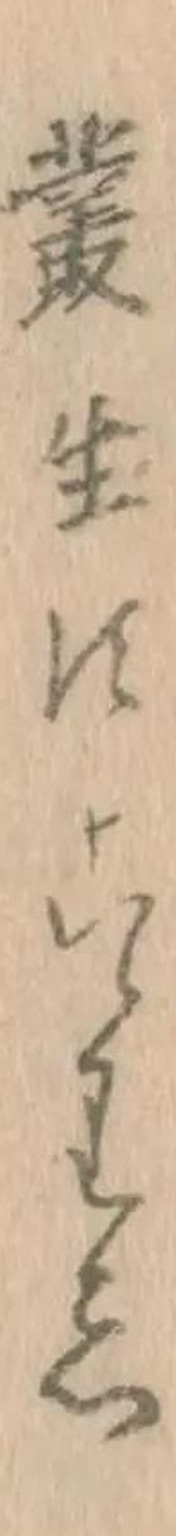叢生すこゝりし
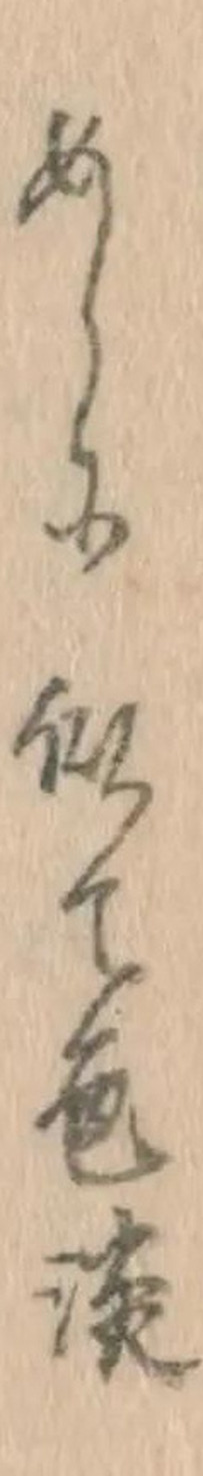めしに似て色淡
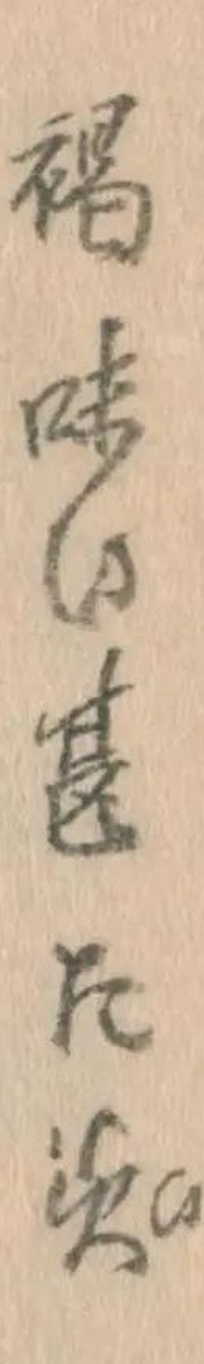褐味ひ甚た美

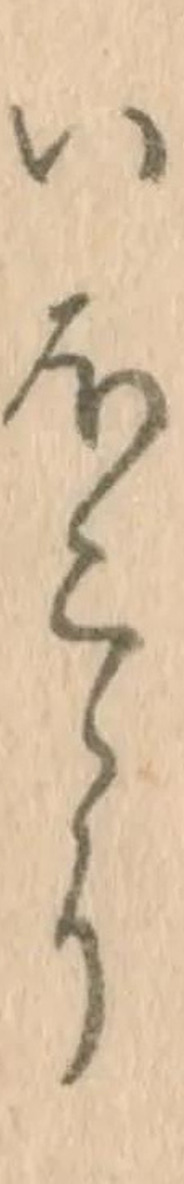いほこゝり
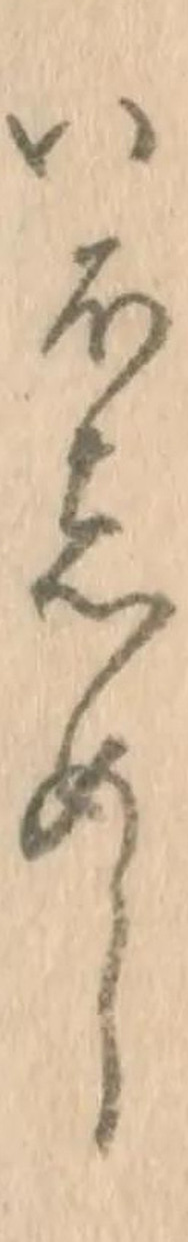いほしめし
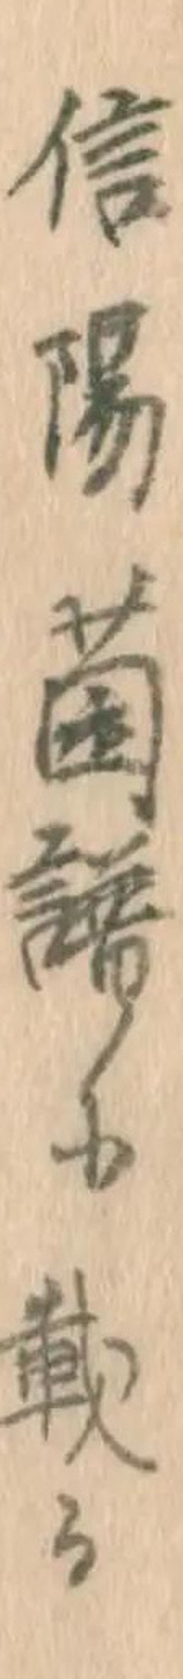信陽菌譜に載る
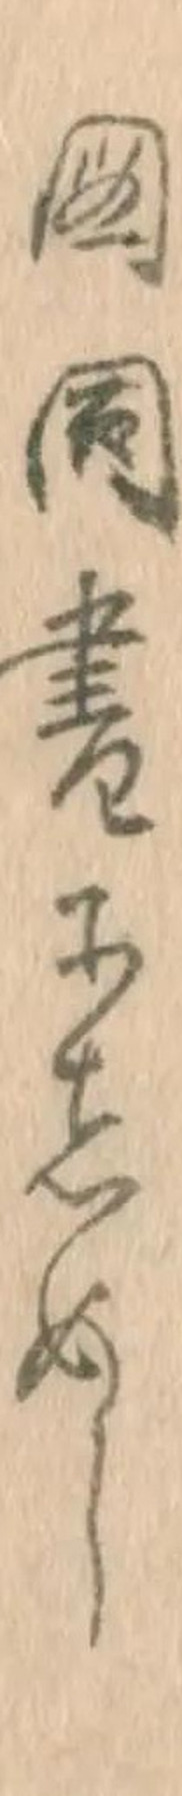図同書にしめし
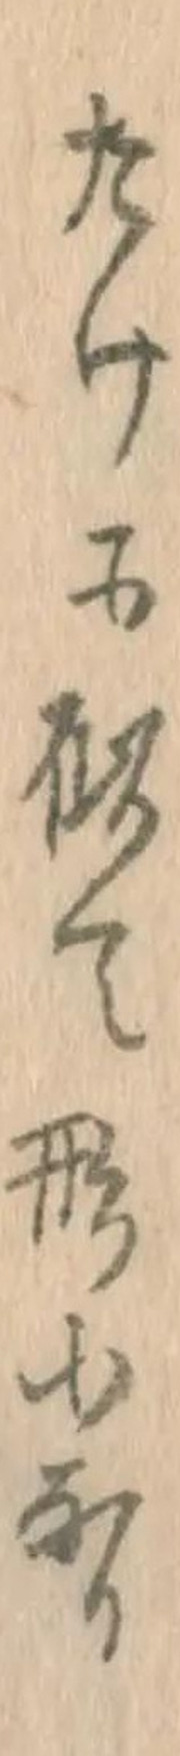たけに似て形小なり
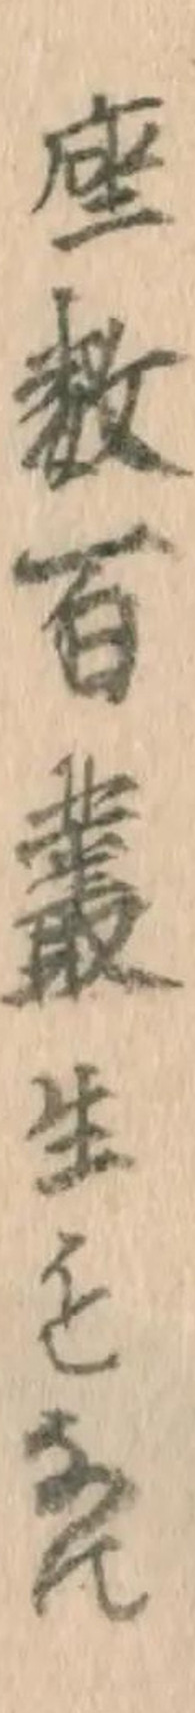座数百叢生をなす
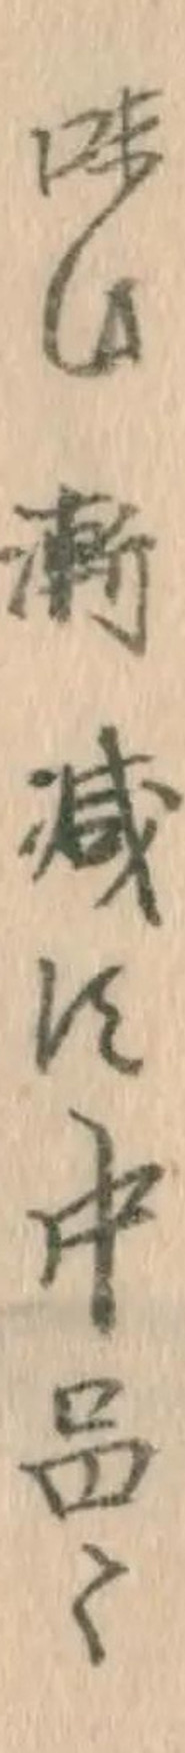味ひ漸減す中品と
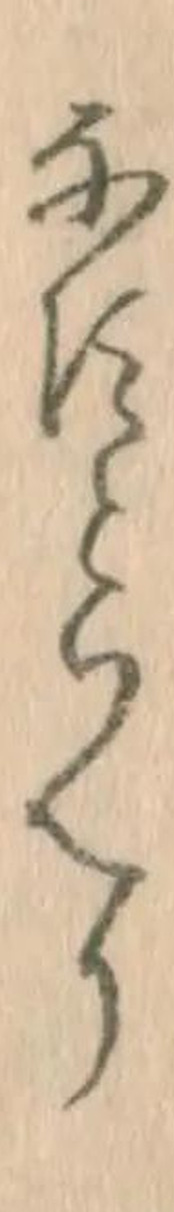なすといへり
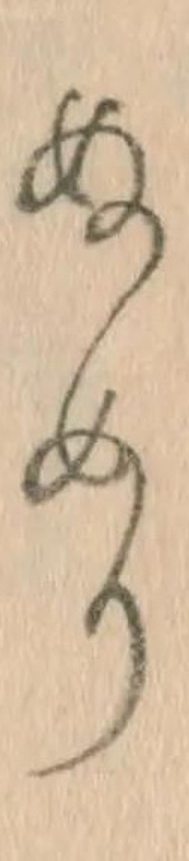ぬめり
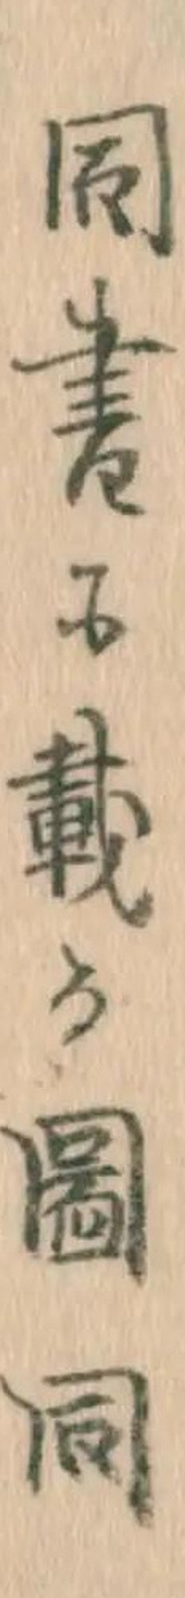同書に載る図同
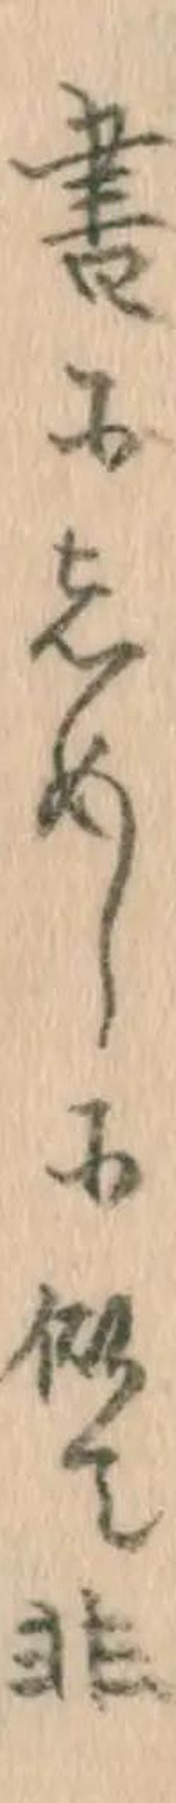書にしめしに似て非
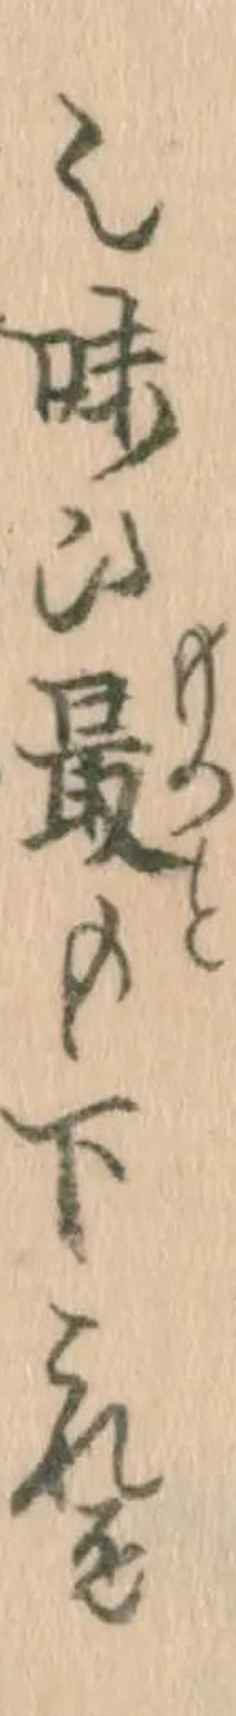也味ひ最も下これを
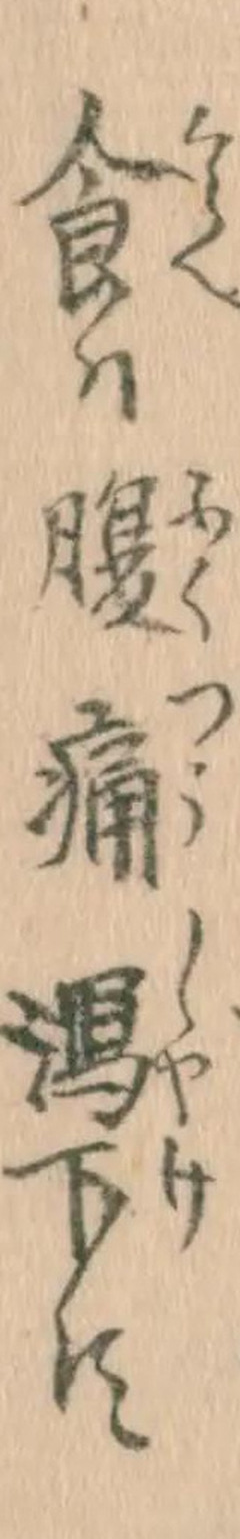食は腹痛瀉下す
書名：本草図譜. 巻55-57
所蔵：国立国会図書館 National Diet Library, JAPAN
